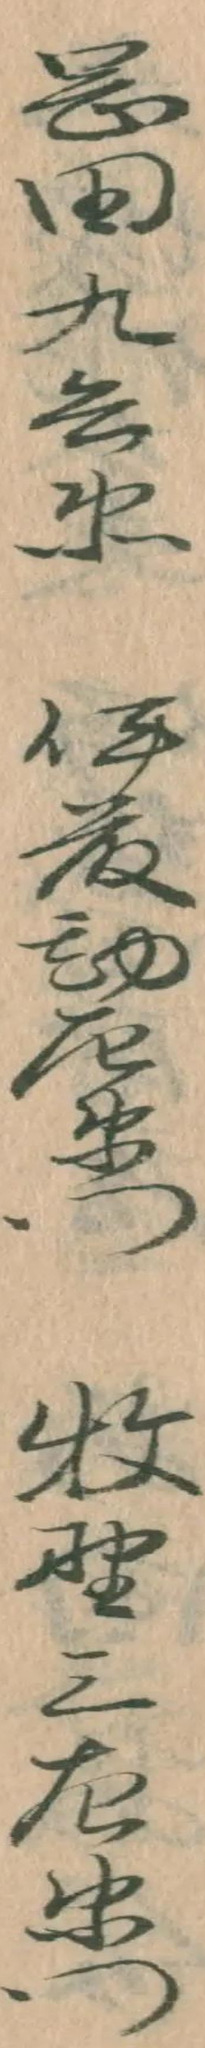岡田九兵衛伊藤勘左衛門牧野三左衛門
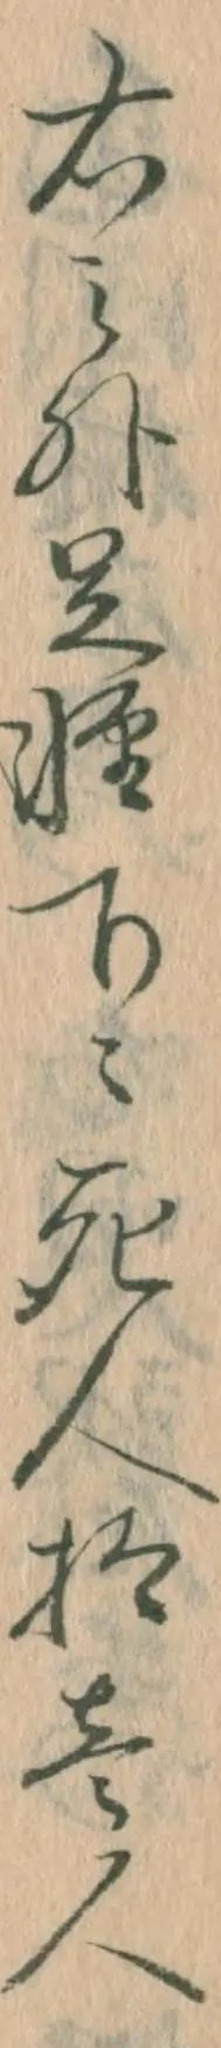右之外足軽下々死人拾壱人
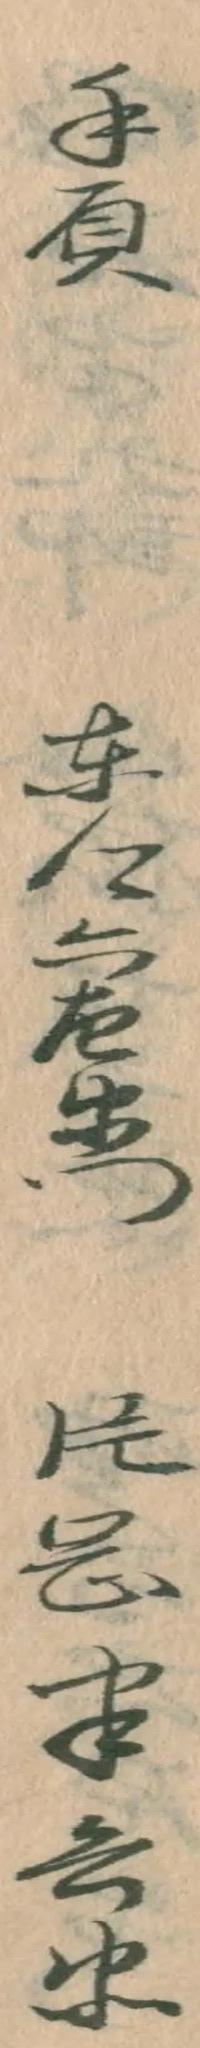手負本郷六左衛門片岡半兵衛
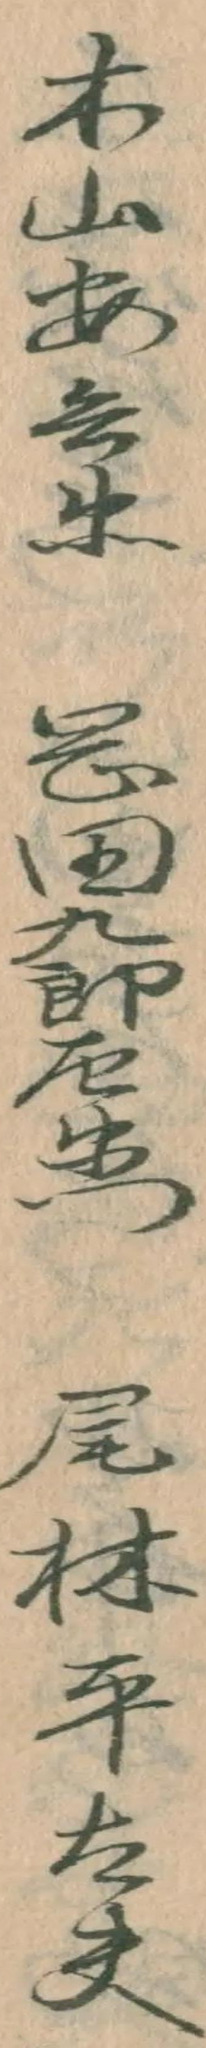木山安兵衛岡田九郎左衛門尾林平太夫
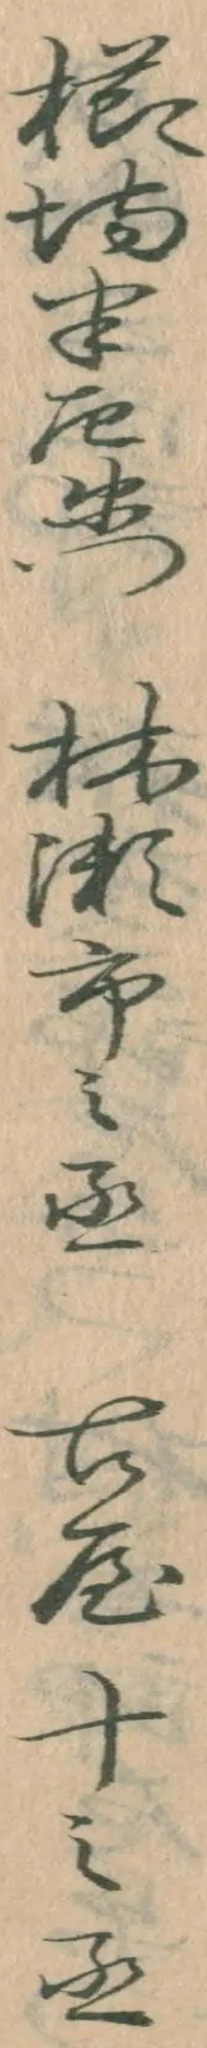櫛場半左衛門林瀬市之丞古屋十之丞
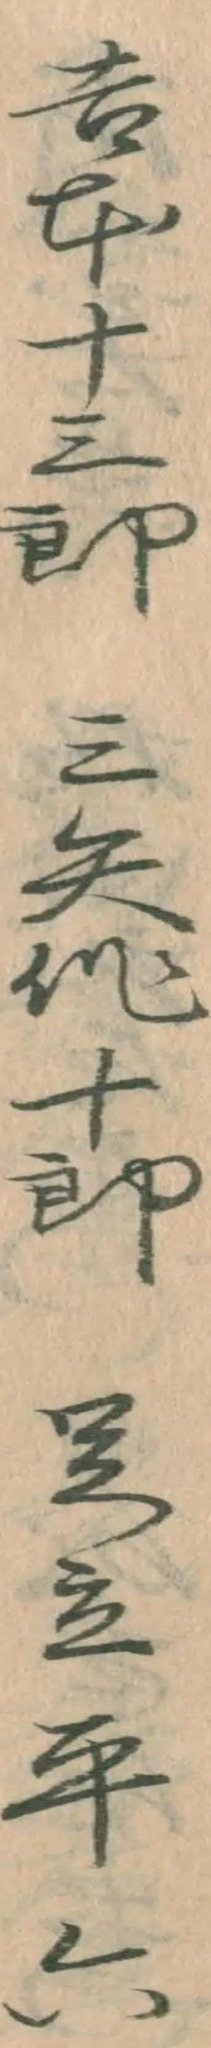吉本十三郎三矢作十郎足立平六

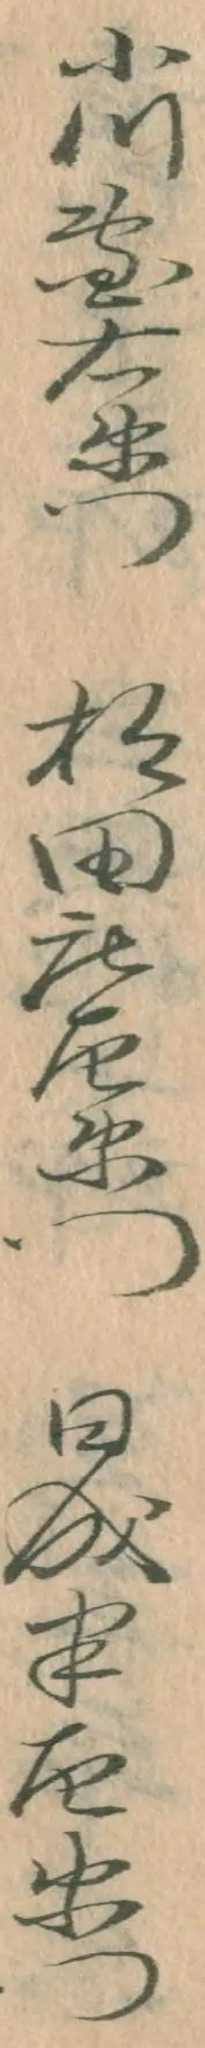小川團右衛門杉田庄左衛門日成半左衛門
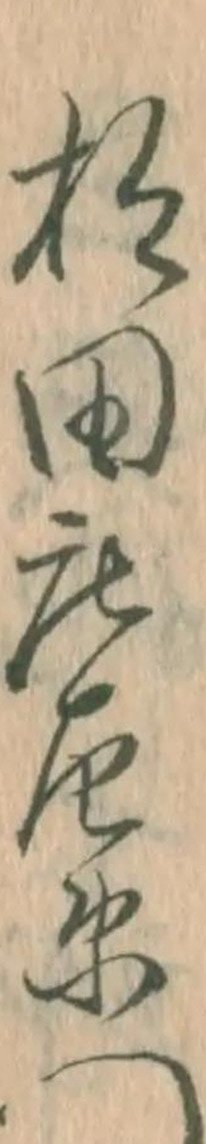広も庄左衛門
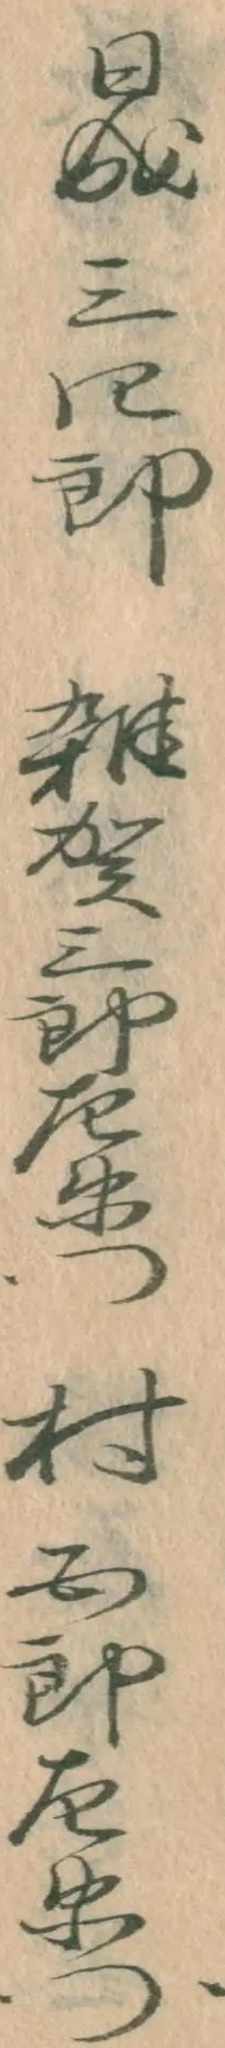日成三四郎雑賀三郎左衛門村五郎左衛門
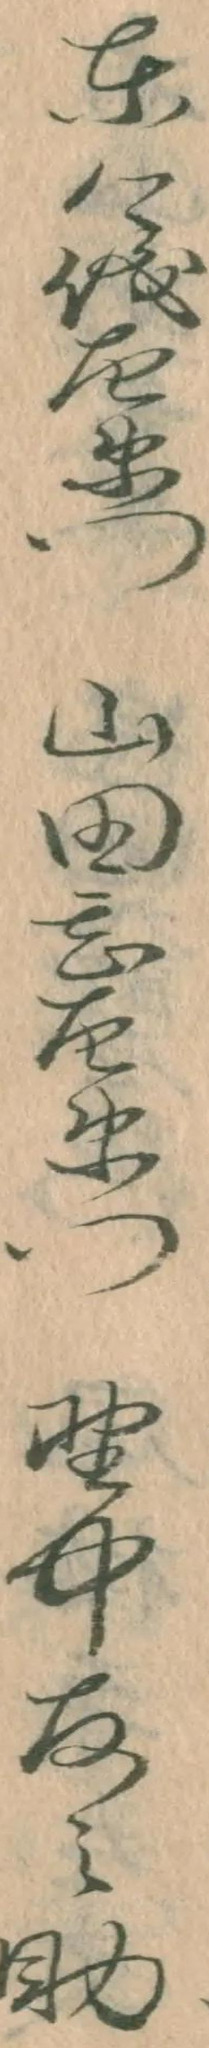本郷儀左衛門山田陣左衛門野中友之助
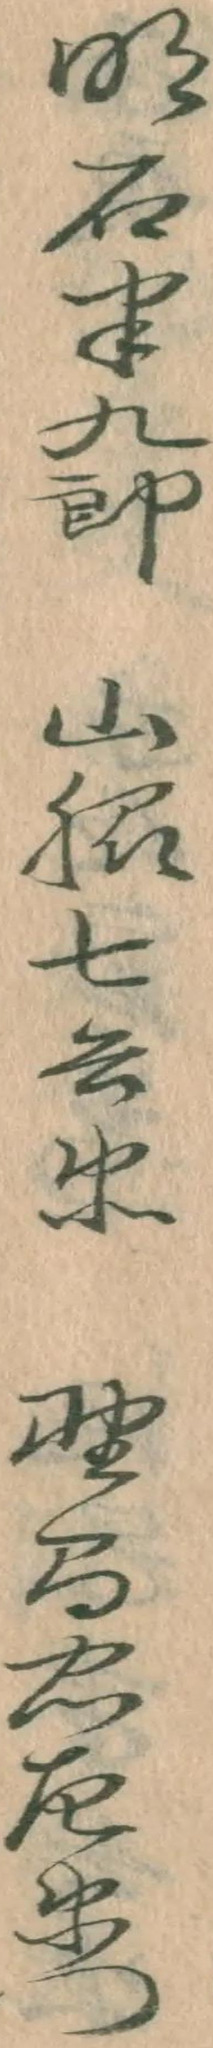明石半九郎山脇七兵衛野間忠左衛門
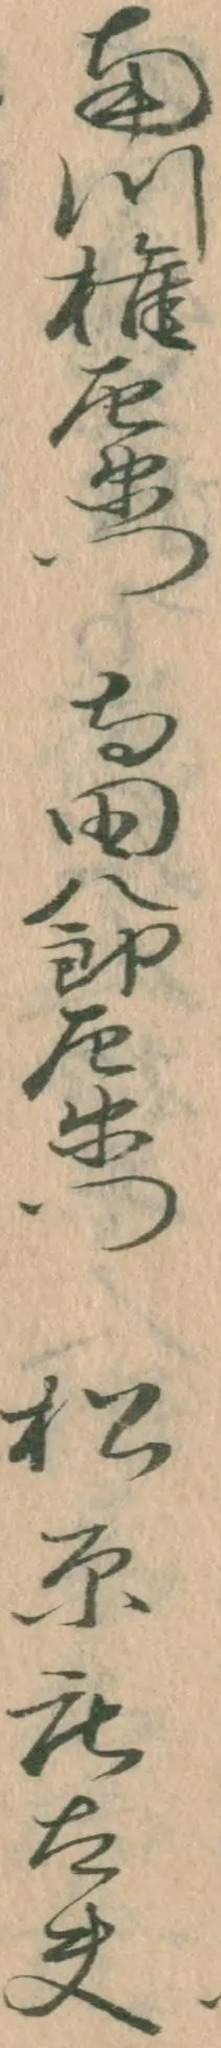南川権左衛門寺田八郎左衛門松原庄太夫
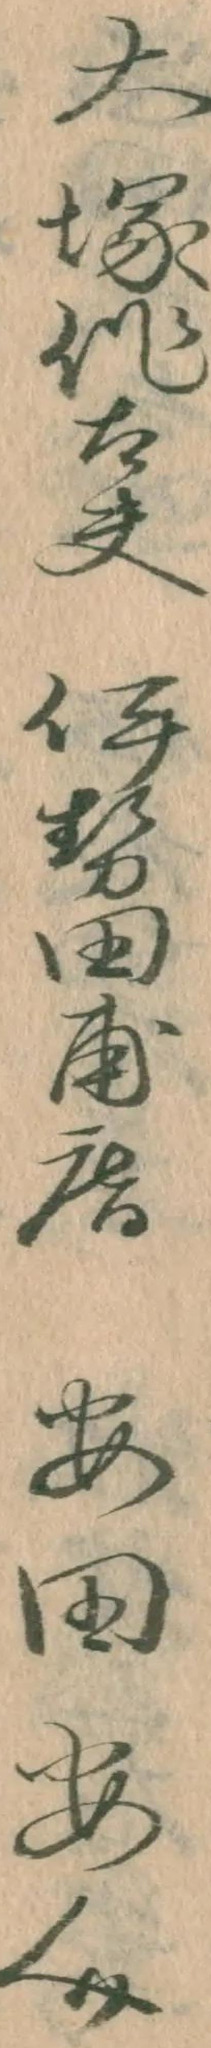大塚作太夫伊勢田甫庵安田安介
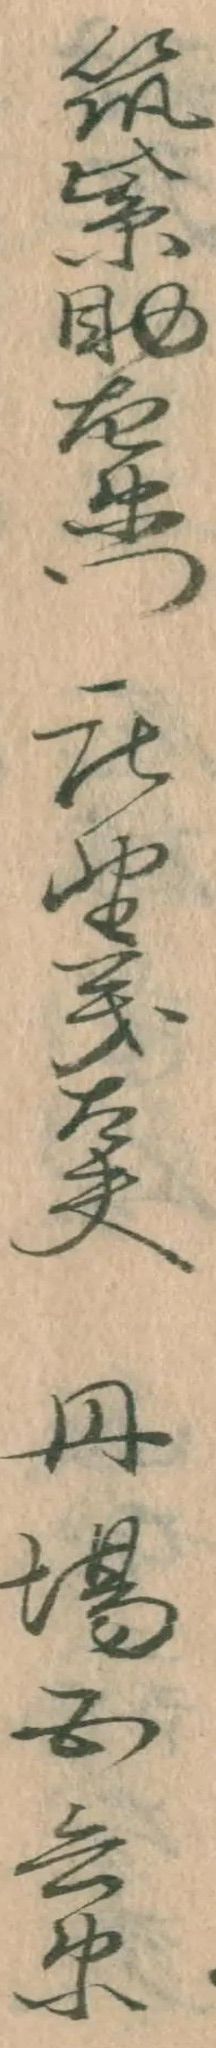筑紫助左衛門庄野義太夫丹場五兵衛
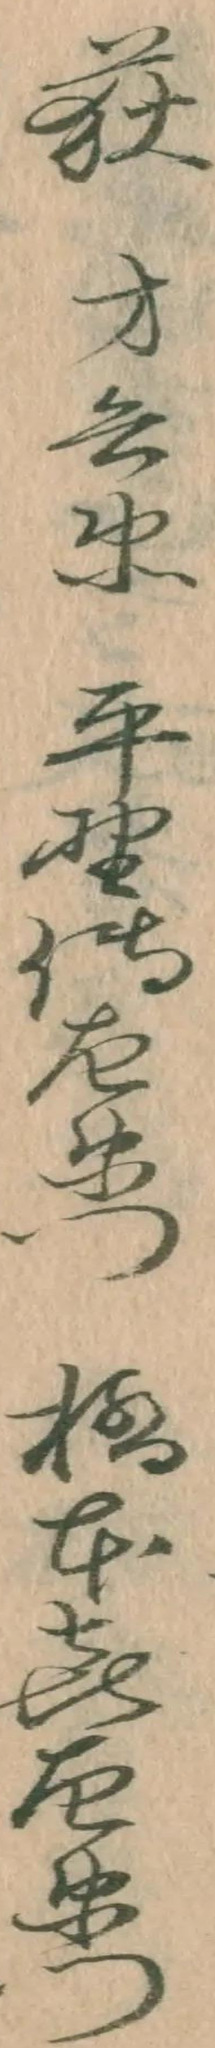萩才兵衛平野伝左衛門橋本喜左衛門
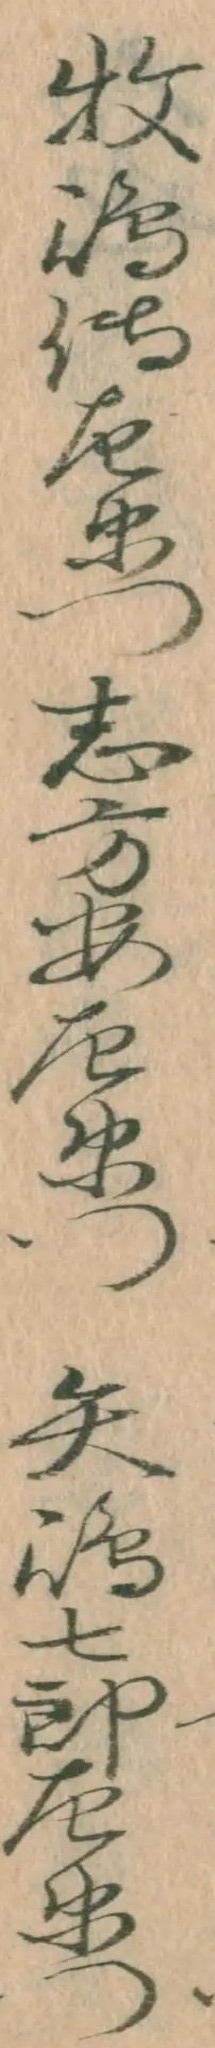牧島伝左衛門志方安左衛門矢島七郎左衛門
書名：切支丹御退治記 49巻. [9]
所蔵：国立国会図書館 National Diet Library, JAPAN
